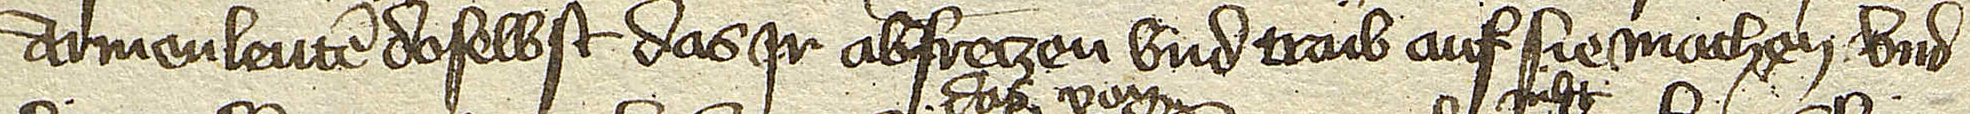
Armenleute* doſelbſt das Ir abfrecʒen vnd traib auf ſie machen vnd
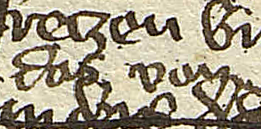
das von
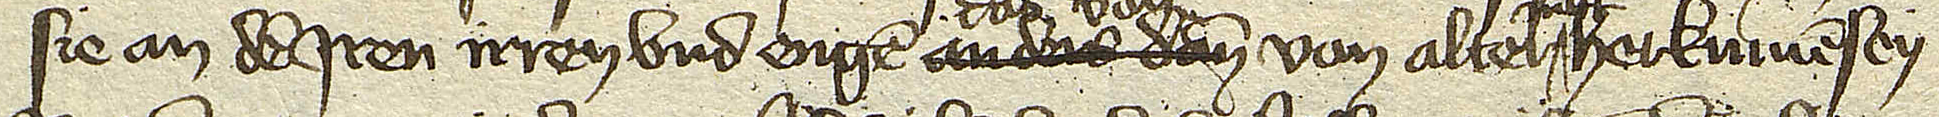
ſie an de* Iren irren vnd enge* an ders dan* von alter herkume* ſey
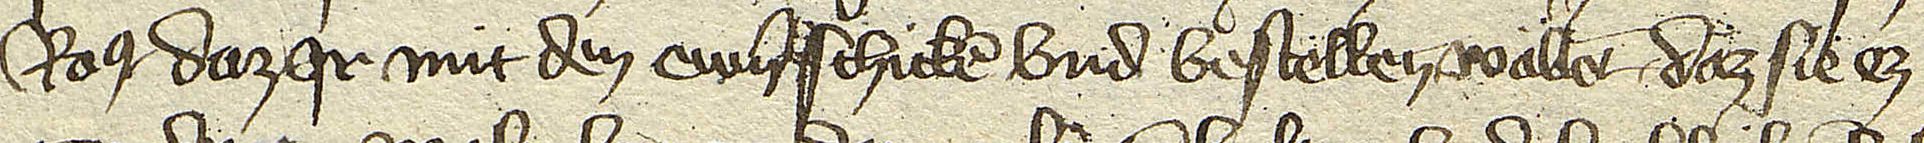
Ro* / daʒ Ir mit den ewn* ſchicke* vnd beſtellen wöllet / daʒ ſie eʒ
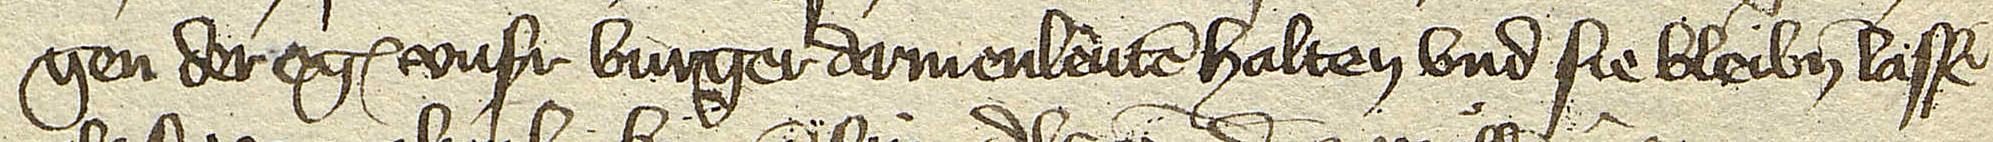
gen der eg* vnſ*r burger Armenleute* halten vnd ſie bleibn* laſſe*
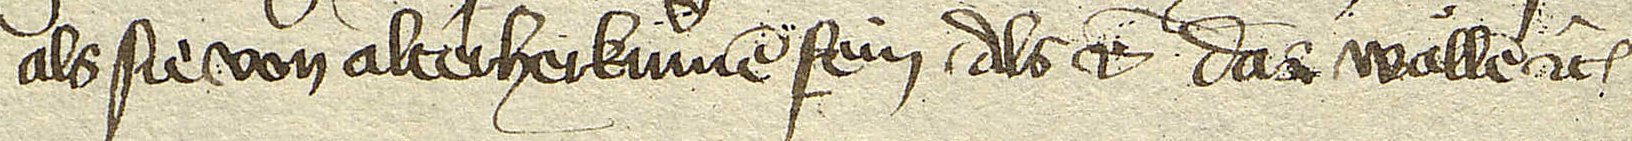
als ſie von alterherkume* ſein / Als ec* das wölle* ec*
